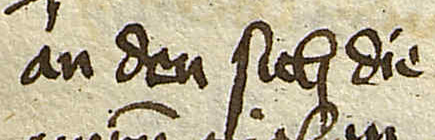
an den ſich die
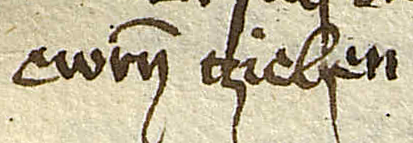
ewrn* cʒiehen
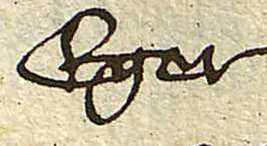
Eger
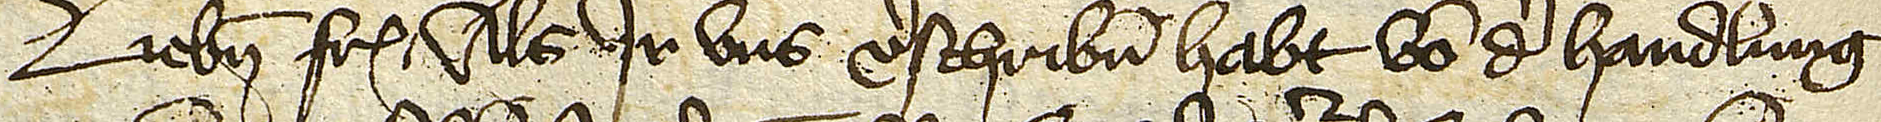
Liebn* fr* / Als Ir vns v*ſchribn* habt vo* d* handlung
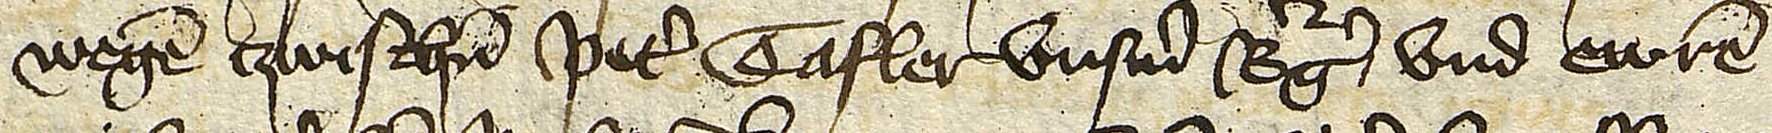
wege* cʒwiſchn* Pet* Tafler vnſm* B*g* / vnd ewre*
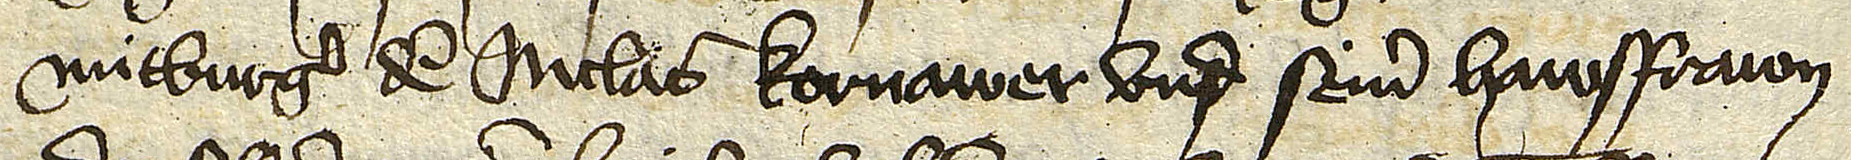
mitburg* d* Niclas Kornawer vnd ſein* hawſfrawn
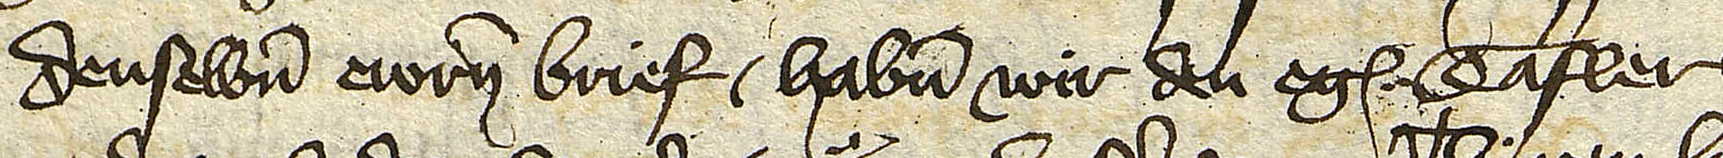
Denſelbn* ewrn* brief / habn* wir den eg* ~ Tafler
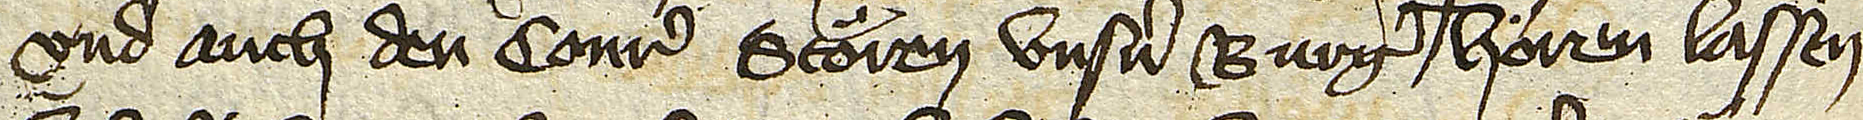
vnd auch den Conr* Stören vnſn* Burg* hören laſſen
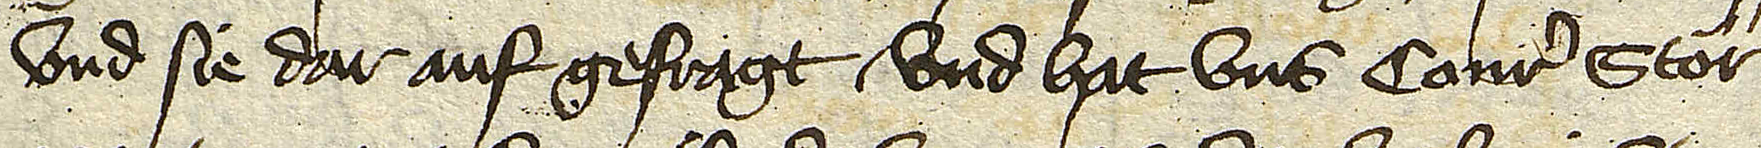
vnd ſie dar auf gefragt / vnd hat vns Conr* Stör
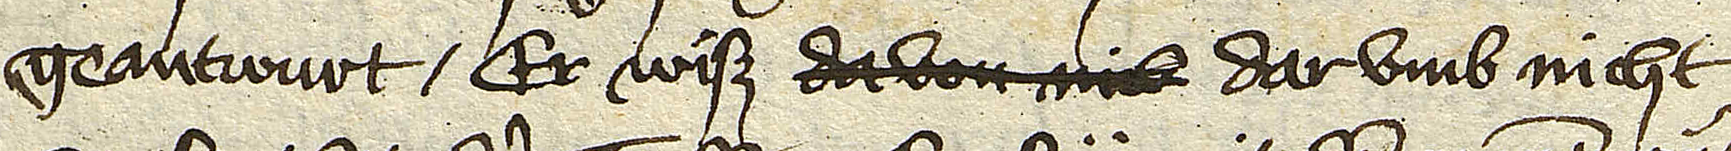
geantwurt / Er wiſʒ davon nich darvmb nicht
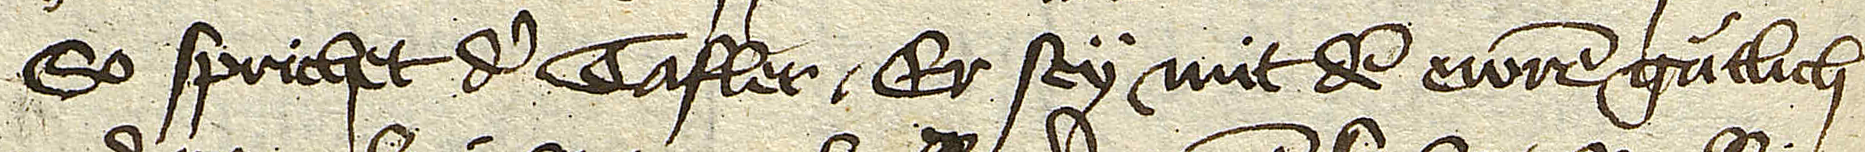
So ſprichet d* Tafler / Er ſey mit d* ewre* gütlich
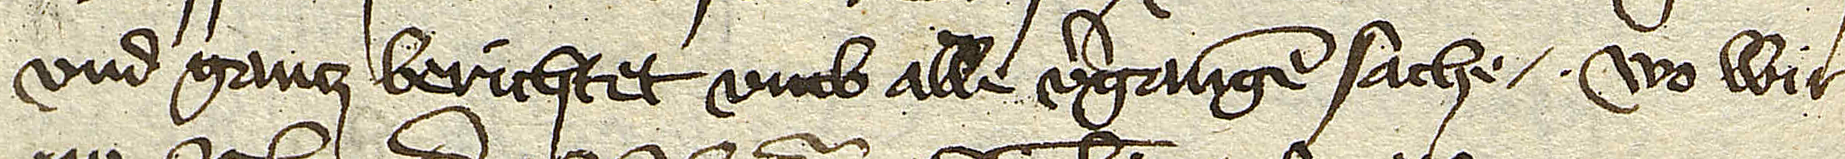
vnd gancʒ berichtet vmb alle v*gange* ſache / . wo wir
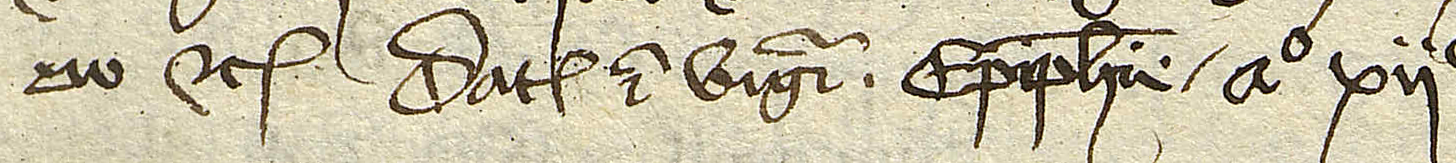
ew ec* Dat* i* vigi* . Epiphie* / a* xii*
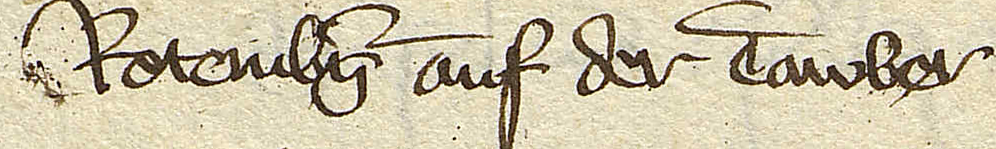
Rotemb*g auf der Tawber
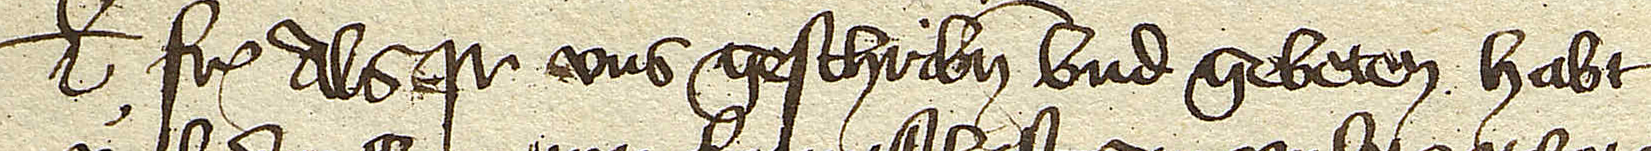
L* fr* Als Ir vns geſchribn* vnd gebeten habt
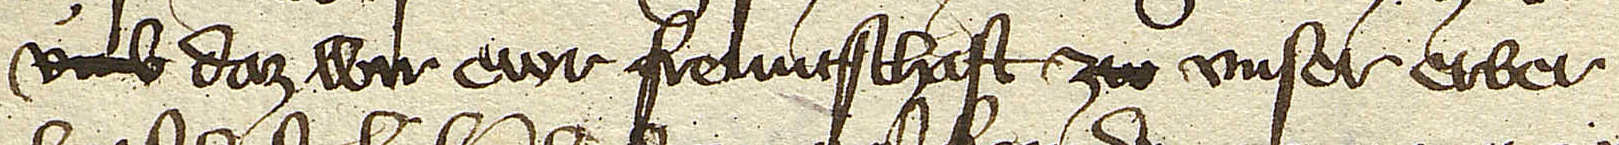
v̈mb daʒ wir ewr freuntſchaft cʒw vnſer erber
